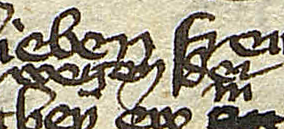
wegen der
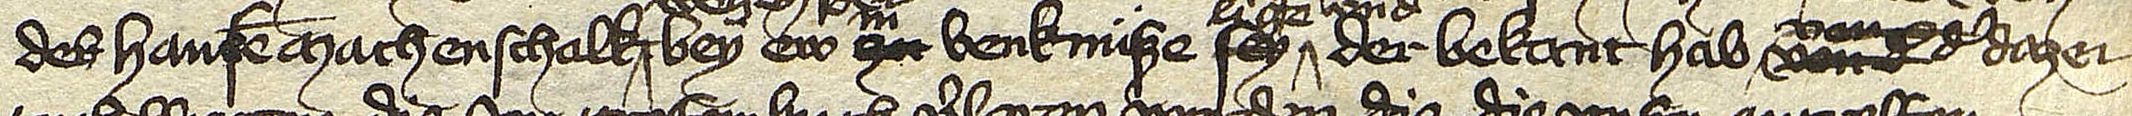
der hanſe* Machenſchalk bey ew cʒu venknüſʒe ſey der bekant hab von d d* daʒ er
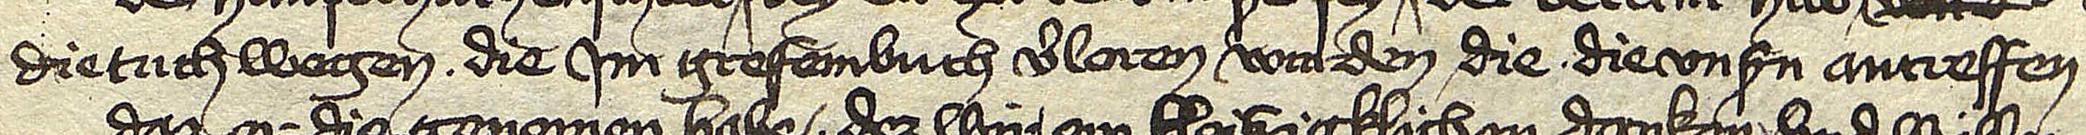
die tuch wegen . die Im grefembuch v*loren worden die die vnſ*n antreffen
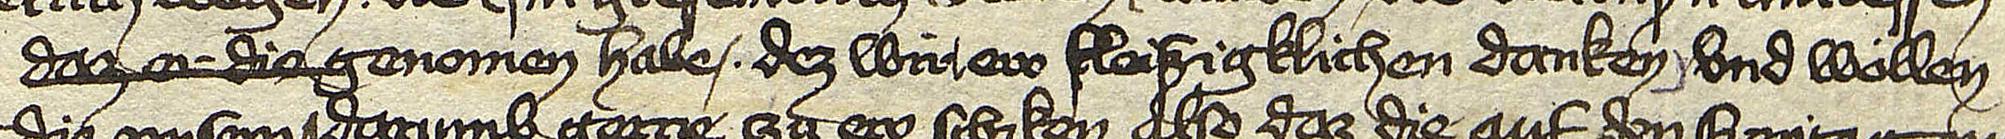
daʒ er die genomen habe / . deʒ wir ew fleiſʒigklichen danken vnd wöllen
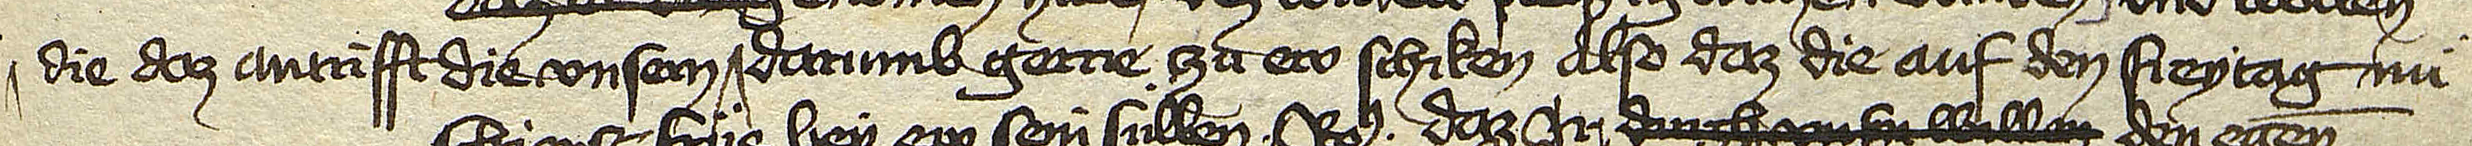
die daʒ antrifft die vnſern darumb gerne cʒu ew ſchiken alſo daʒ die auf den freytag nü
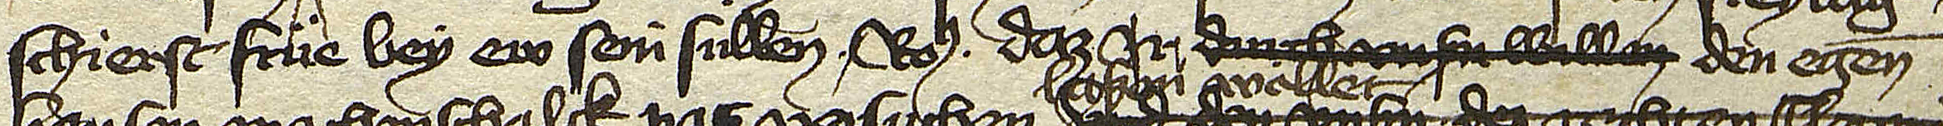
ſchierſt früe bey ew ſein ſüllen . / Ro* . daʒ Ir durch vnſ*n willen den egen*
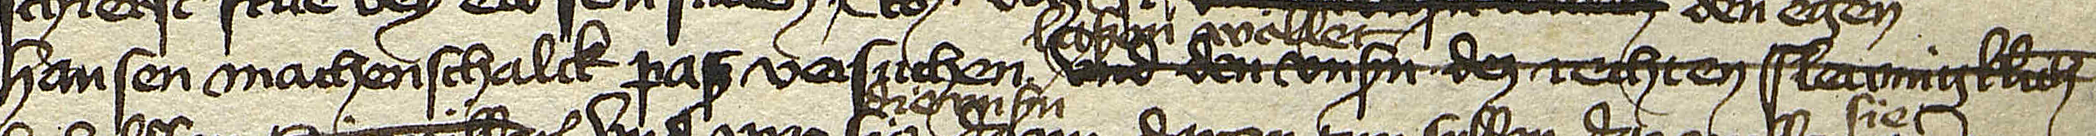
Hanſen machenſchalck paſʒ verſuchen vnd den vnſ*n deʒ rechten ſlewnigklich*
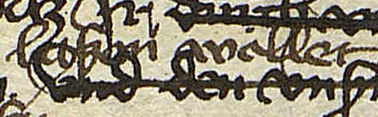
laſʒen wöllet /
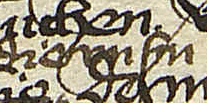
die vnſ*n
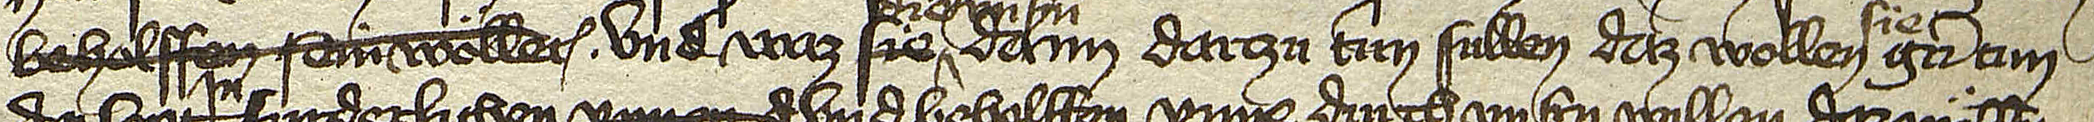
beholffen ſein wöllet* . vnd waʒ ſie dann darcʒu tun ſullen daʒ wollen gn* tun
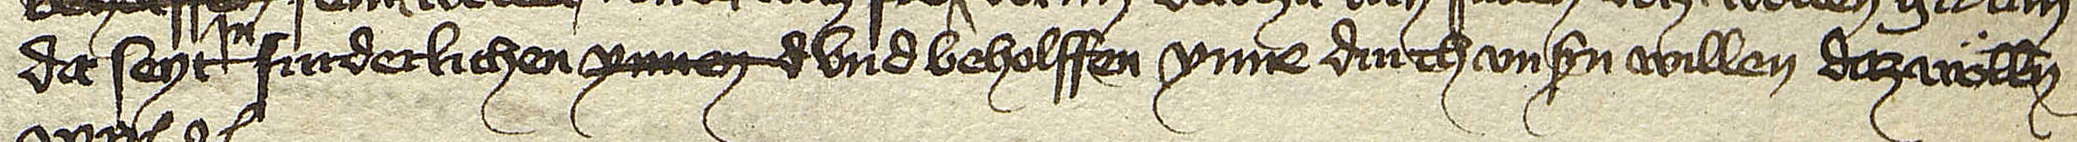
da ſeyt furderlichen ynnen d vnd beholffen ynne durch vnſ*n willen daʒ wölln*
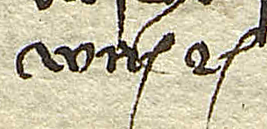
wir* ec*
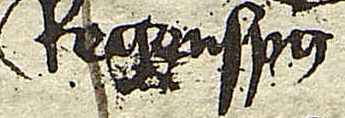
Regenſp*g
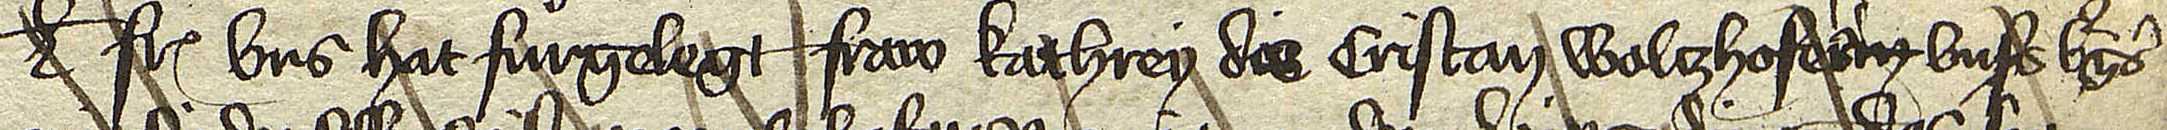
L* fr* vns hat fürgelegt fraw Kathrey des Criſtan wolcʒhofersin* vnſ*s b*g*s
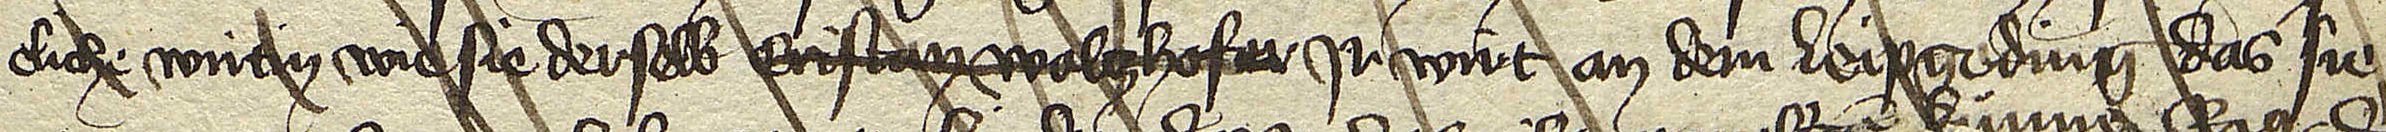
eliche wirtin wie ſie derſelb Criſtan wolcʒhofer Ir wirt an dem leipgeding das ſie
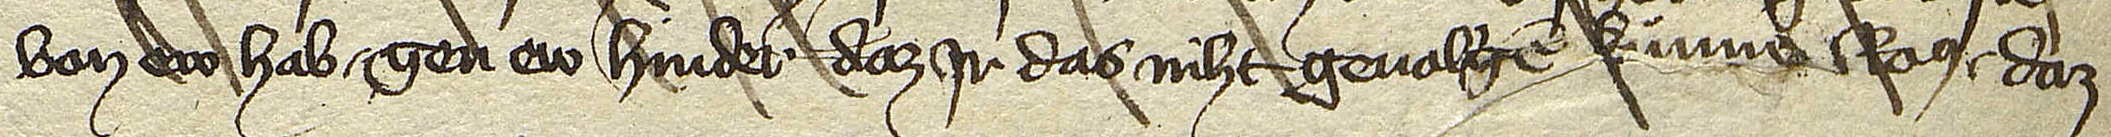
von ew hab / gen ew hinder daʒ Ir das niht geuolge* künne Ro* / daʒ
